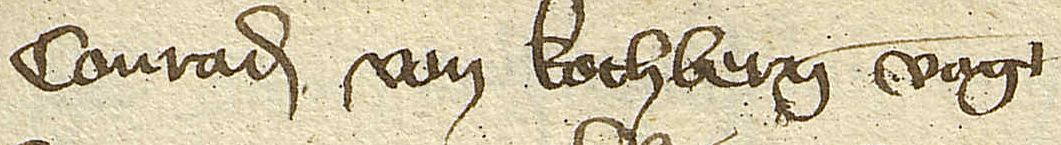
Conrad* von kochberg vogt
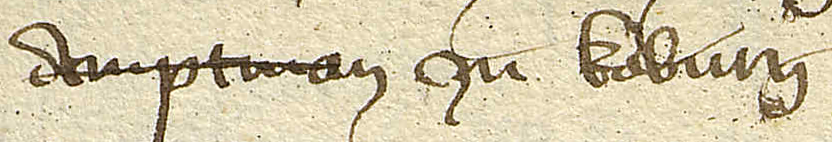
Amptman cʒu Koburg
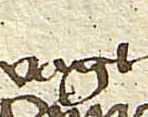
vogt
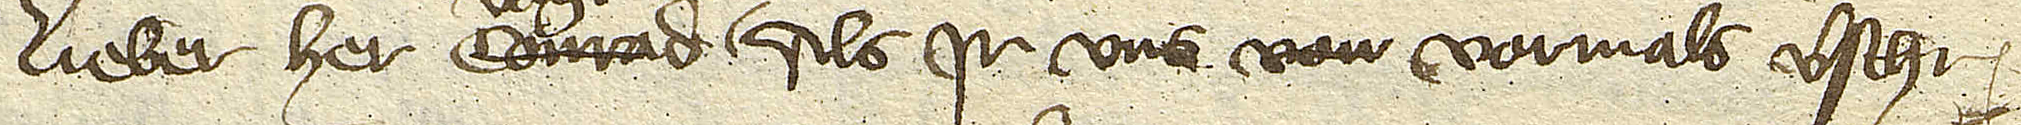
Lieber her Conrad / Als Ir vns von vormals v*ſchr
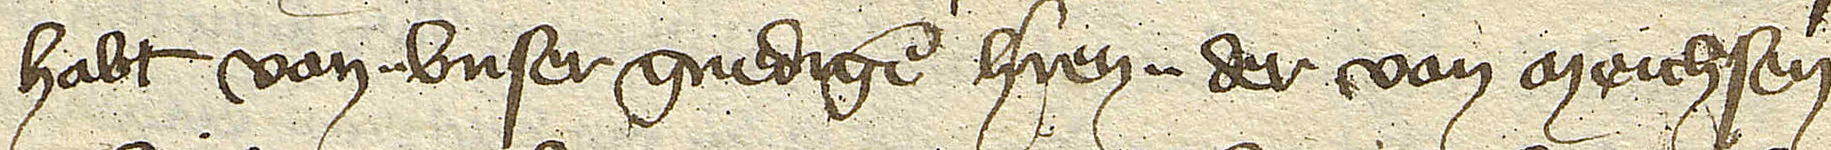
habt von ~ vnſer gnedige* h*ren ~ der von Meichſen
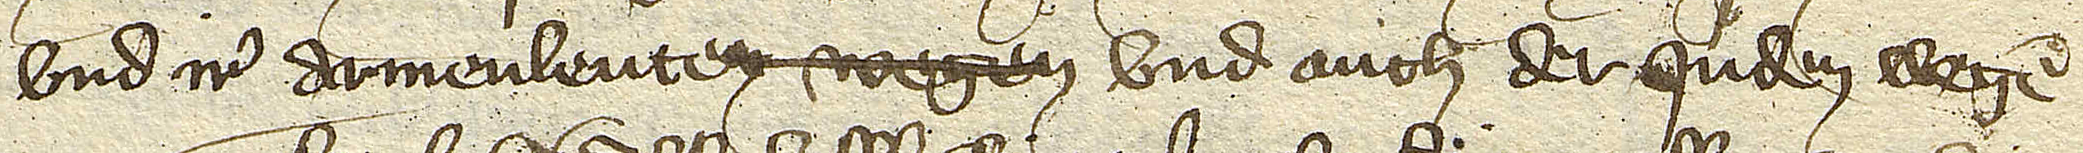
vnd ir* Armenleuten wegen vnd auch der Iuden wege*
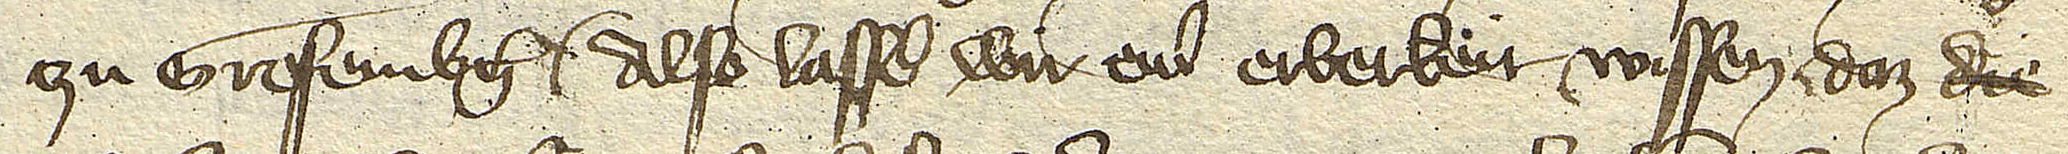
cʒu Grefembg* / Alſo laſſe* wir ew* erberkeit wiſſen / daʒ die
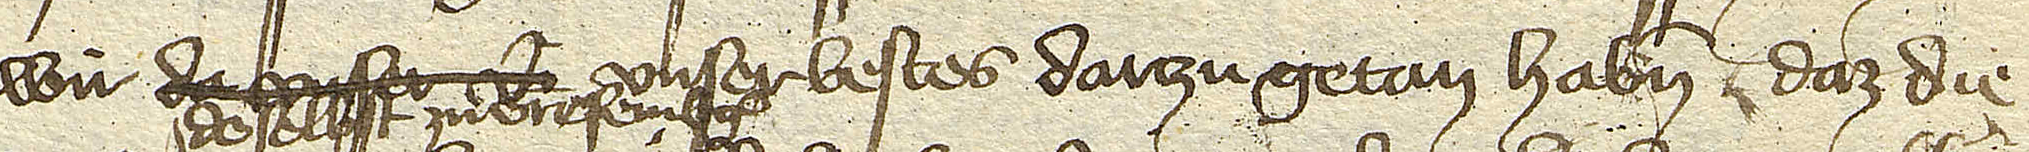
wir da vnſer v* vnſer beſtes darcʒu getan habn* / daʒ die
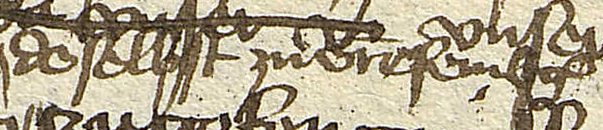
doſelbſt ʒu Grefembg*
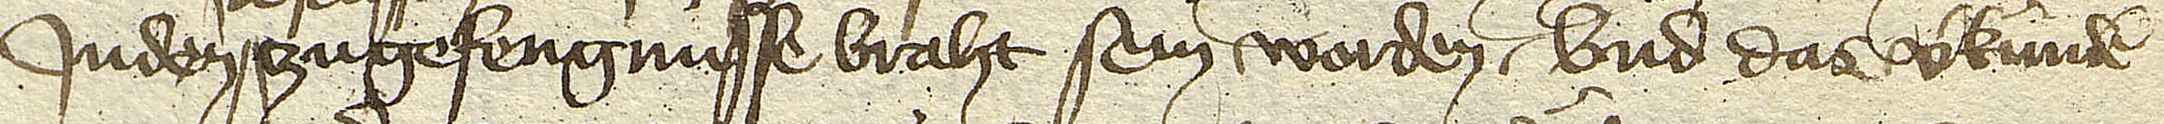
Iuden cʒu gefengnüſſe braht ſein worden / vnd das v*künde*
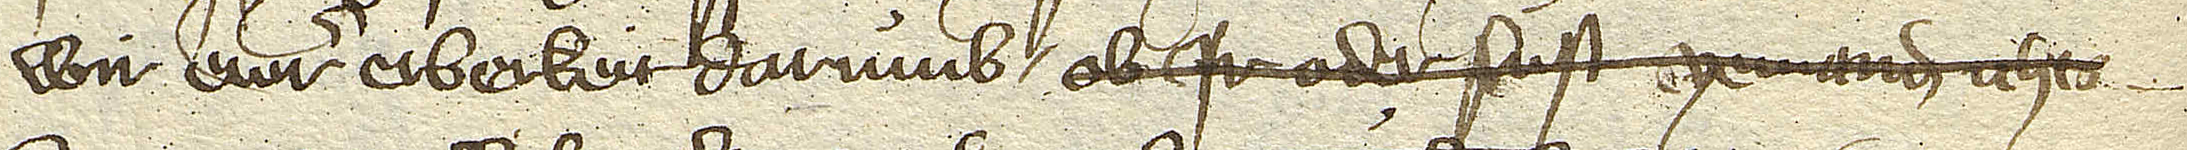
wir ewr* erberkeit darümb / ob Ir oder ſüſt yemand* ichts
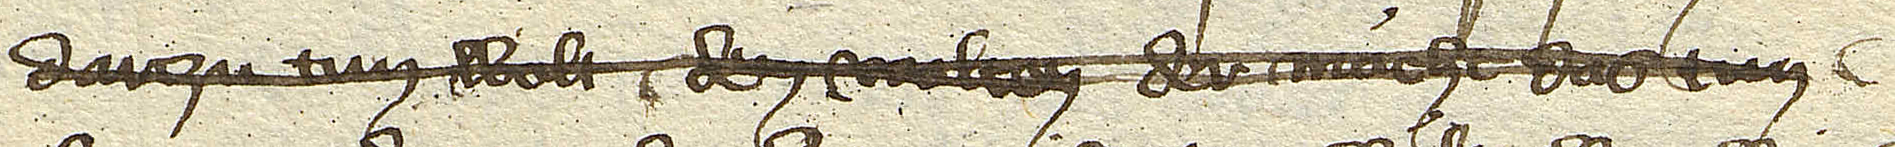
darcʒu tun wolt / dem wolten der möcht das tun /
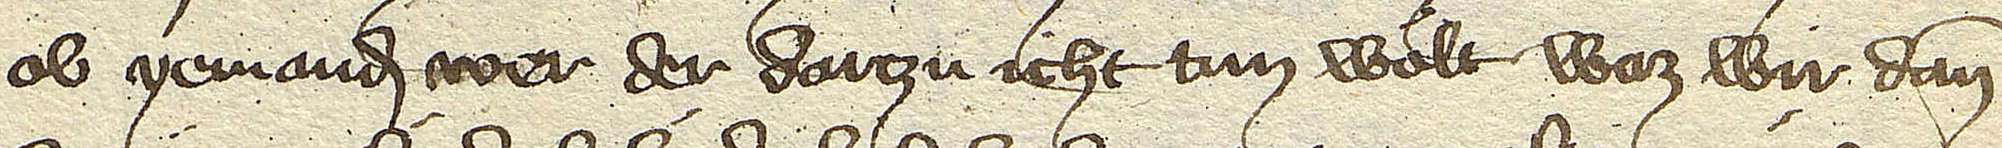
ob yemand* wer der darcʒu icht tun wölt / waʒ wir dan*
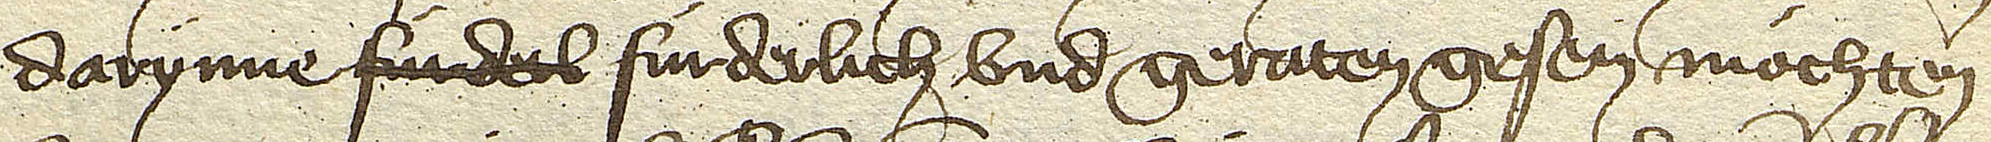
darynne fürderl fürderlich vnd geraten geſein möchten
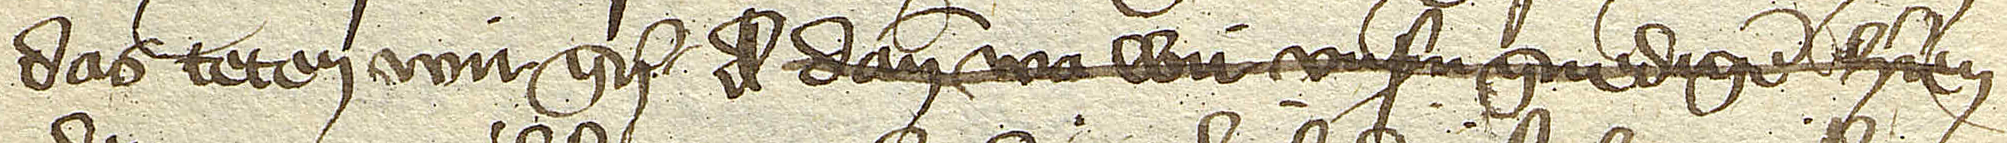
das teten wir gn* / d dan* wo wir vnſ*n gnedige* hr*en
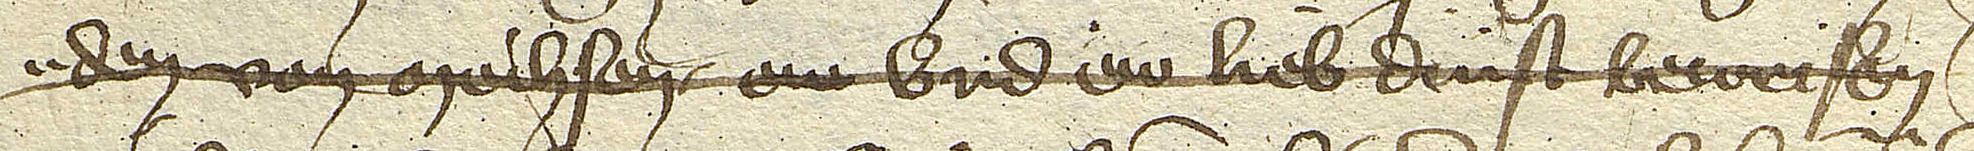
~ den von Meihſen / ew vnd ew lieb dinſt beweiſen
